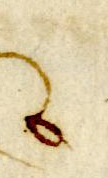@
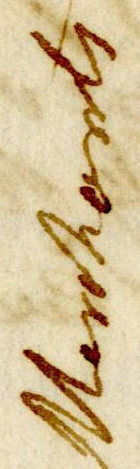Merchants
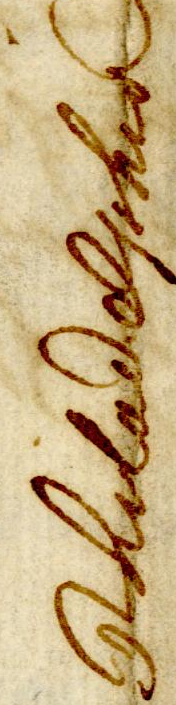Philadelphia
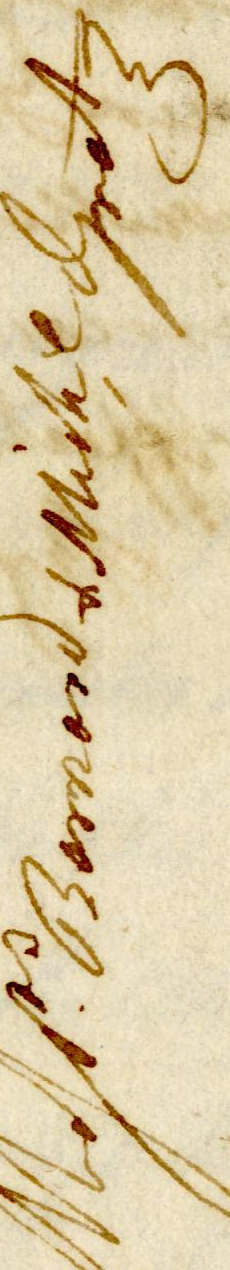Mess^rs Barnard & Mich^l Gratz
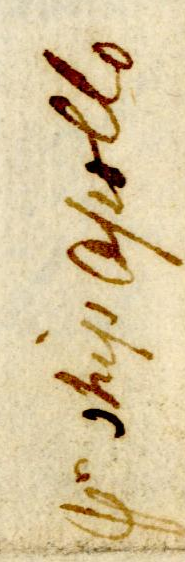per ships Apollo
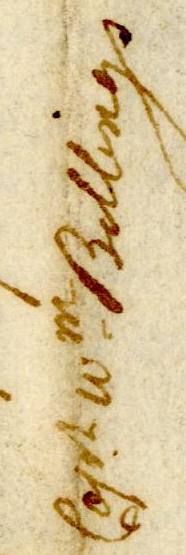Cap^t W^m Ballings
